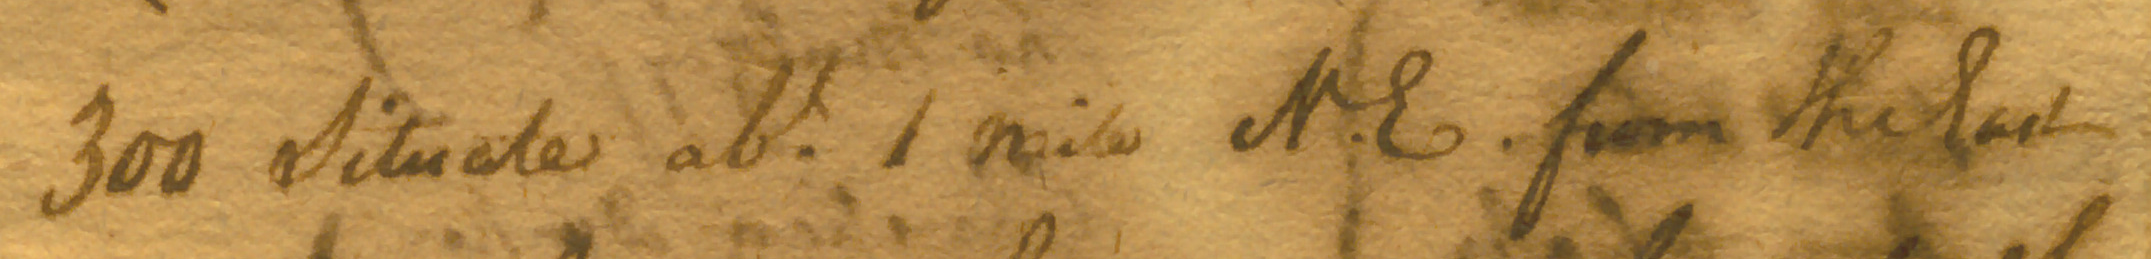300 Situate ab^t. 1 mile N.E. from the East
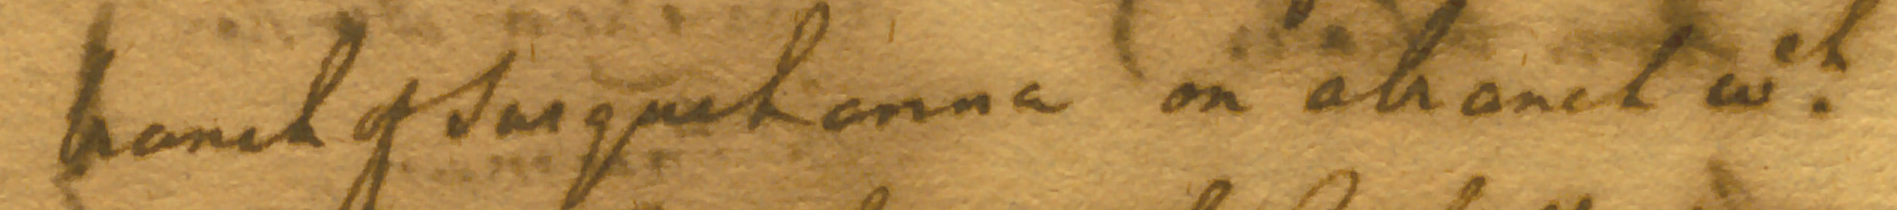branch of the Susquehanna on a branch w^ch.
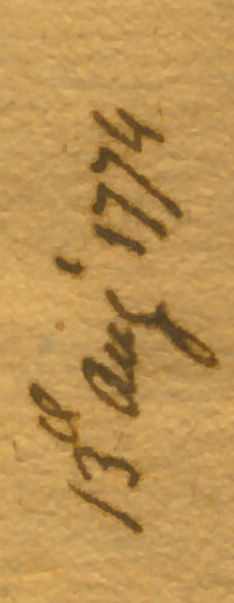13^th Aug^t 1774
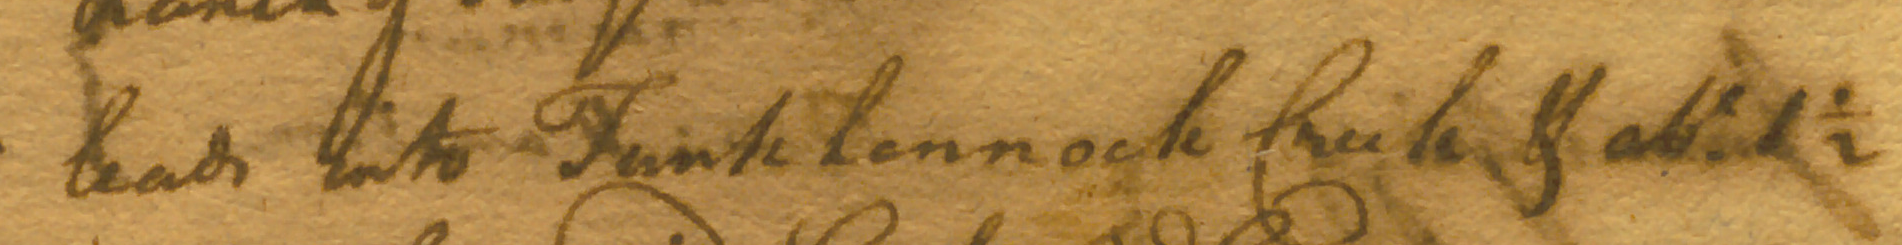leads into Tunkhannock Creek & ab^t. 1 1/2
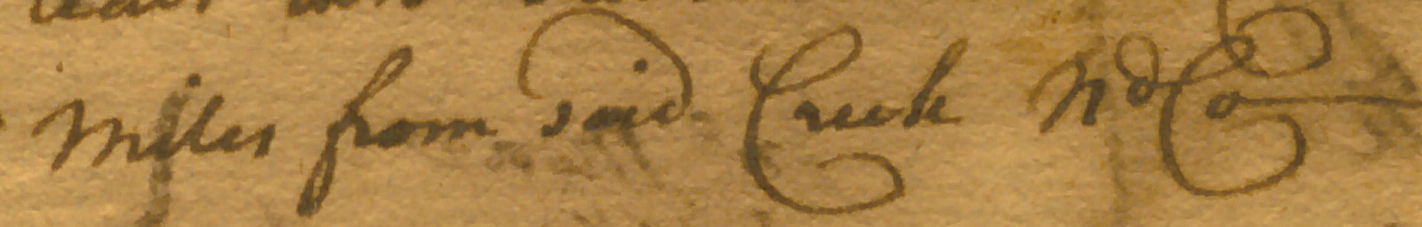miles from said Creek N^d C^o-
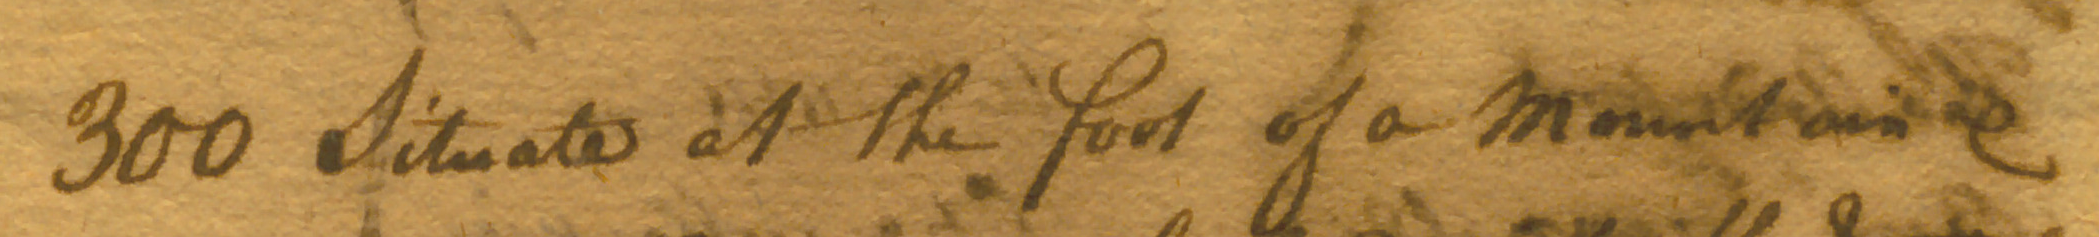300 Situate at the foot of a mountain &
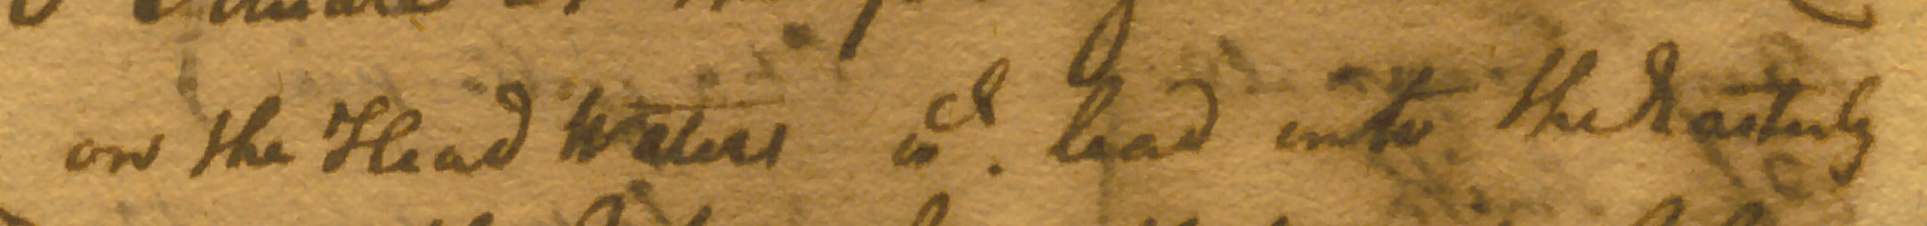on the Head Waters w^ch. lead into the Easterly
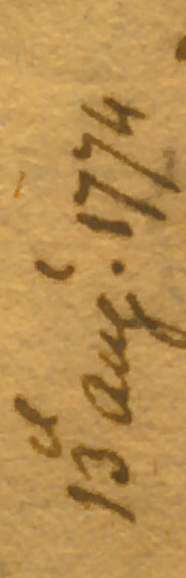13^th Aug^t. 1774
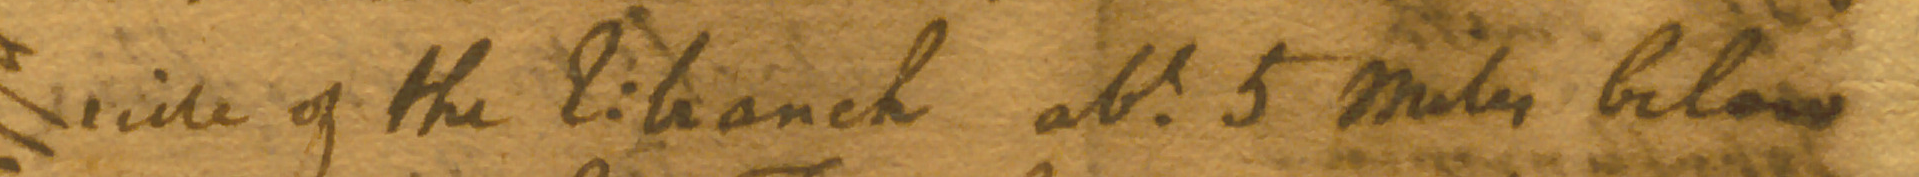side of the E: branch ab^t. 5 miles below
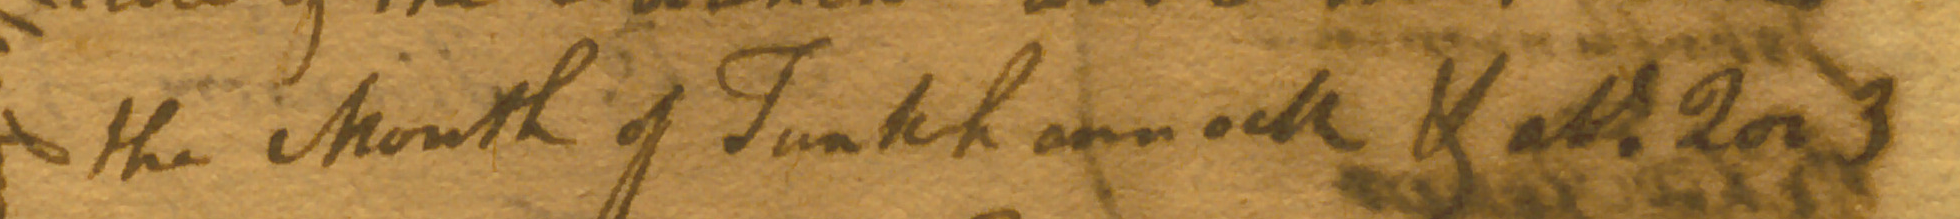the Mouth of Tunkhannock & ab^t. 2 or 3
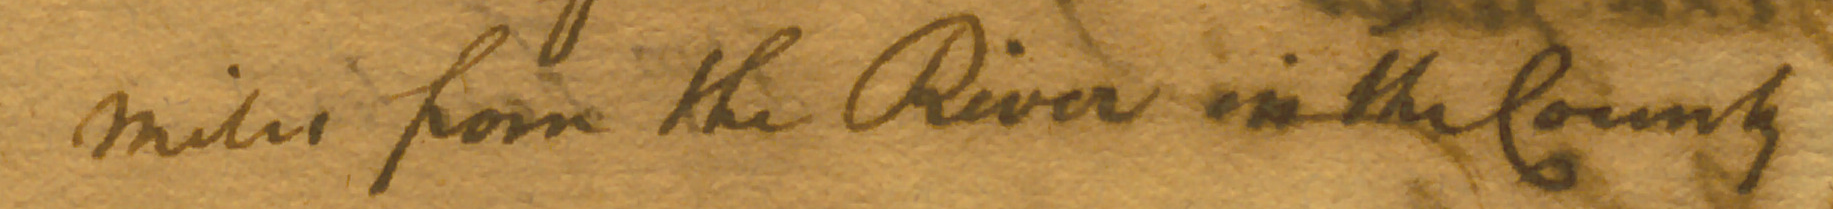miles from the River in the Country
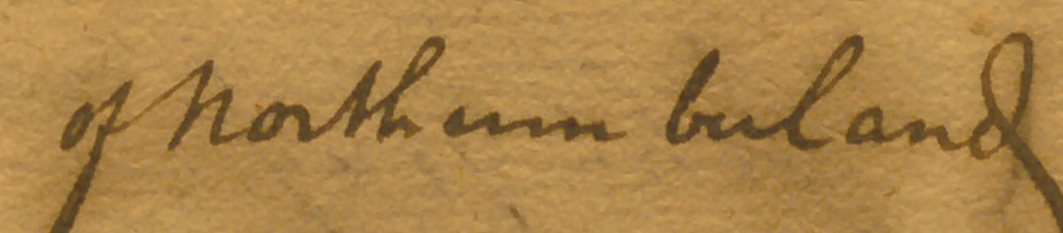of Northumberland
